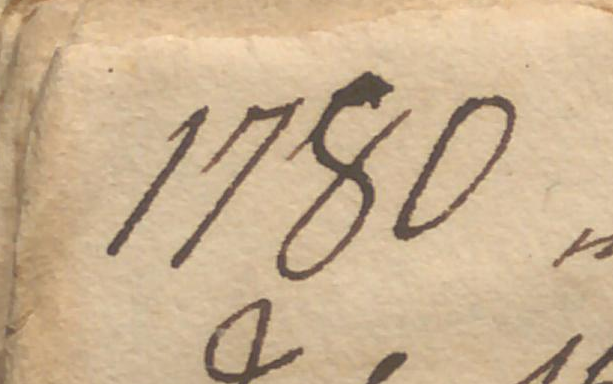1780
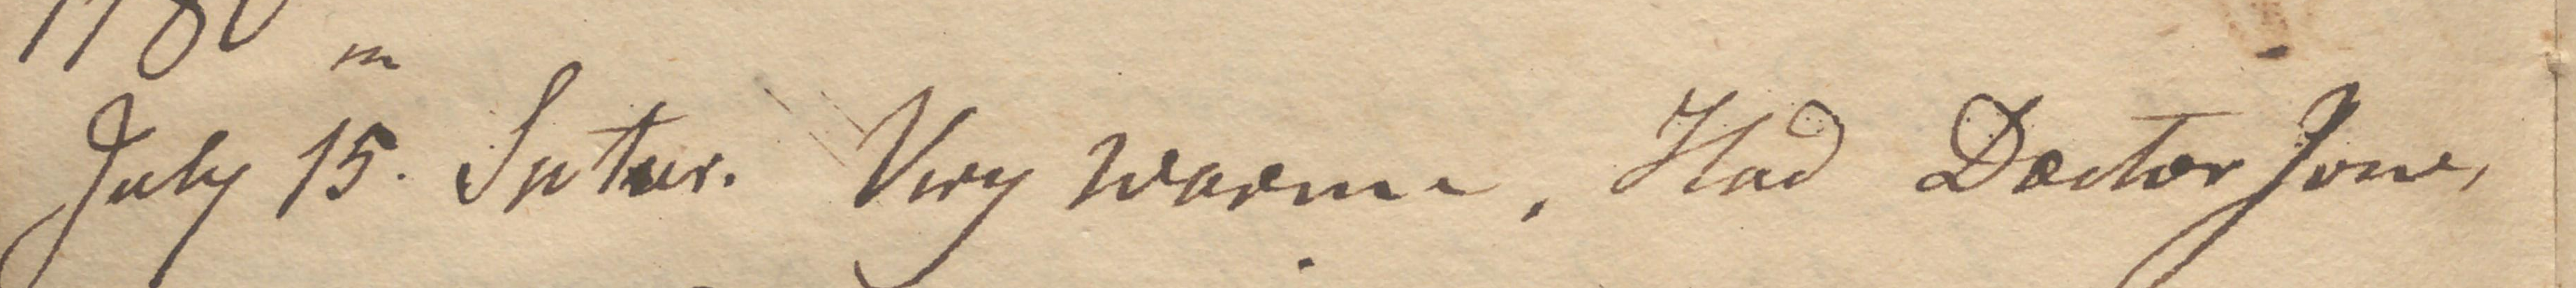July 15^th. Satur. Very warme, Had Doctor Jones
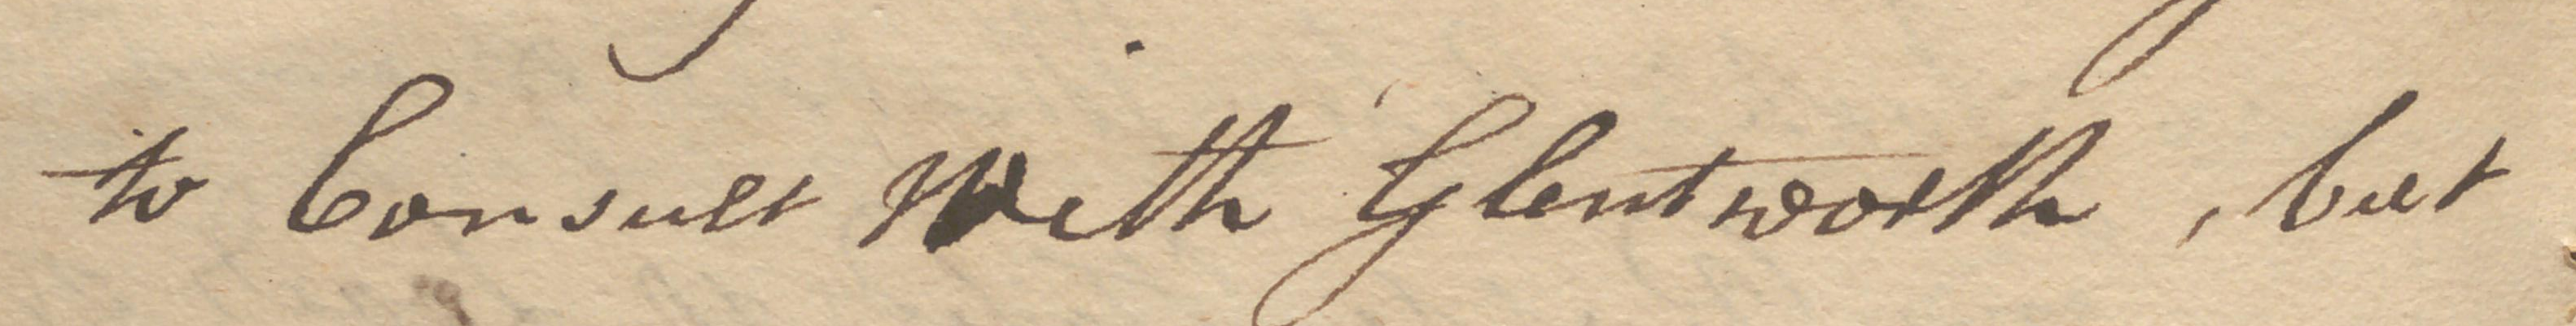to Consult With Glentworth, but
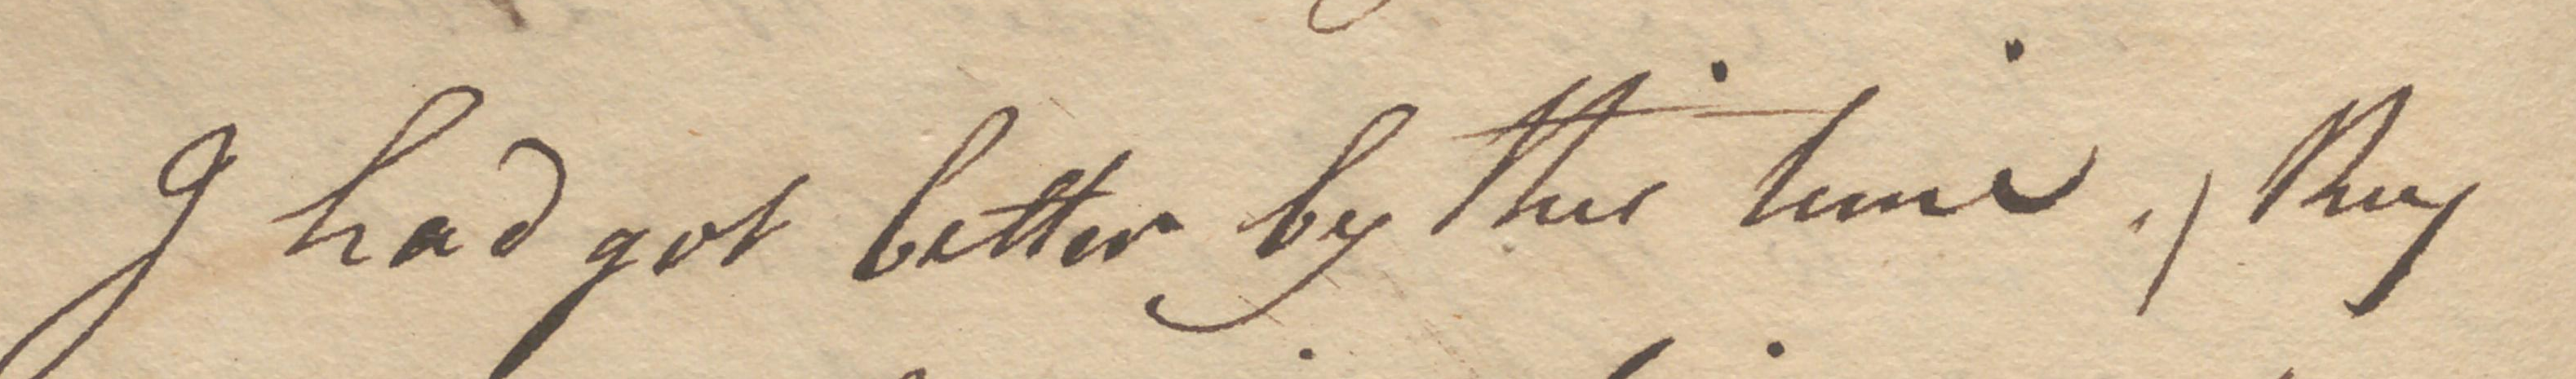I had got better by this time, they
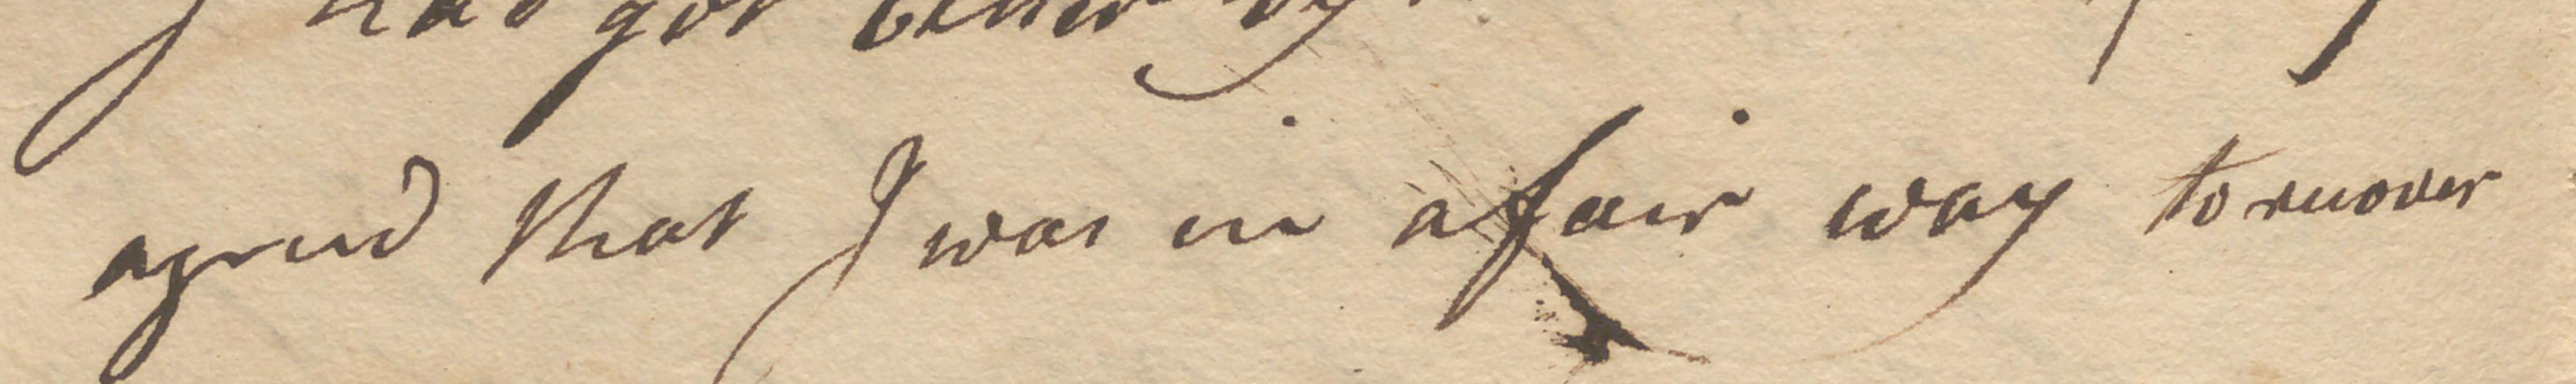agreed that I was in a fair way to recover
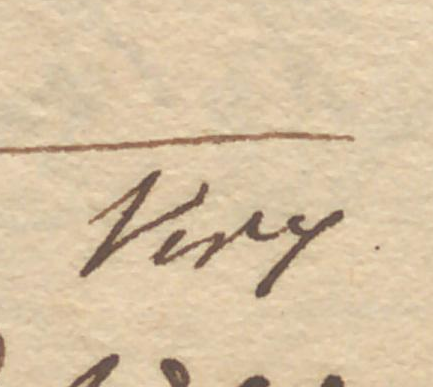Very
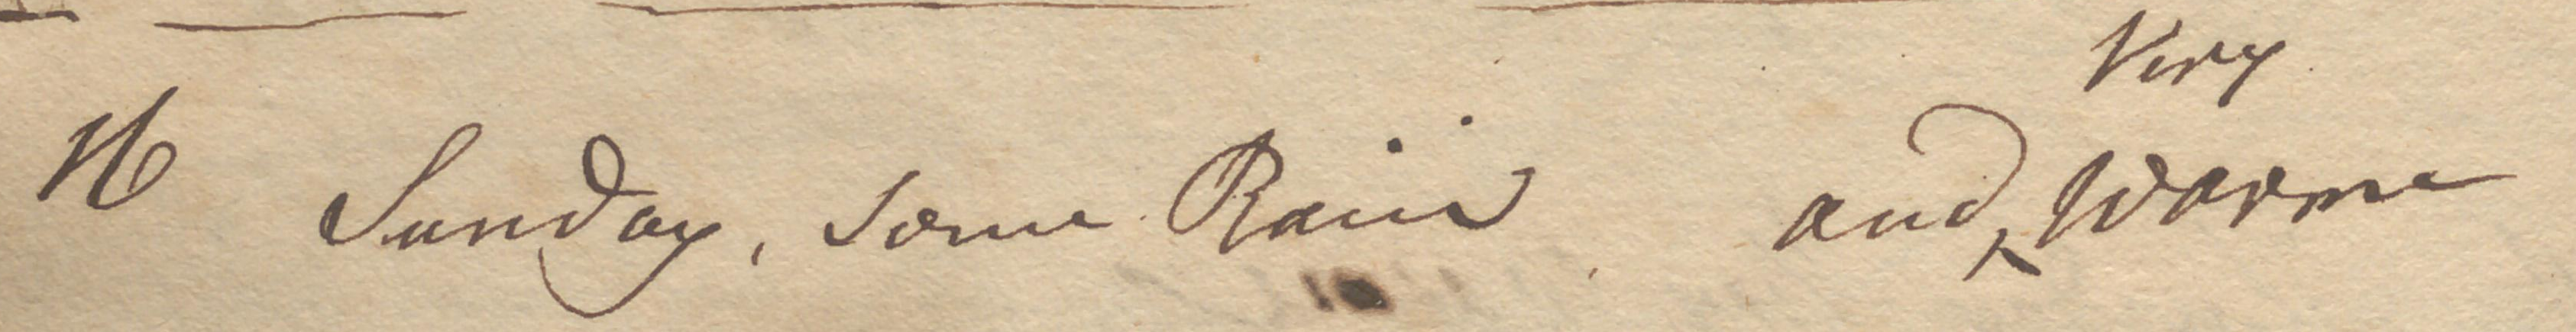16 Sunday, some Rain and ^ warme
